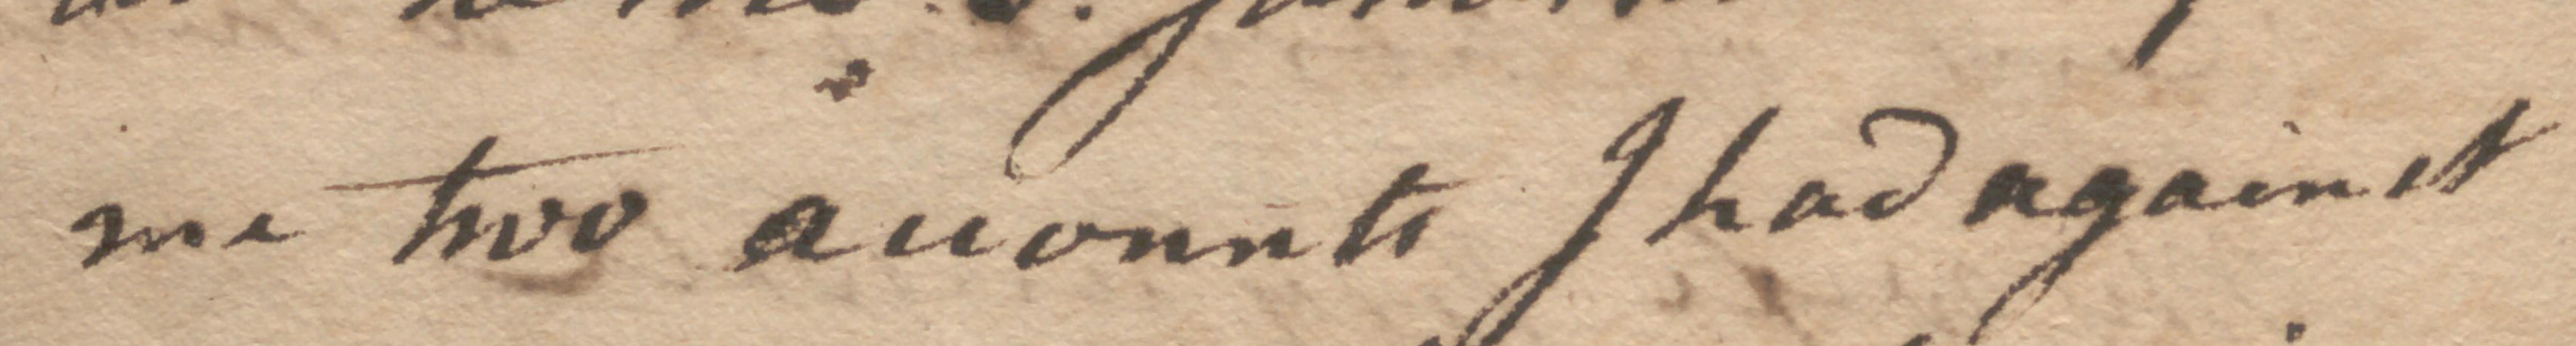me two accounts I had against
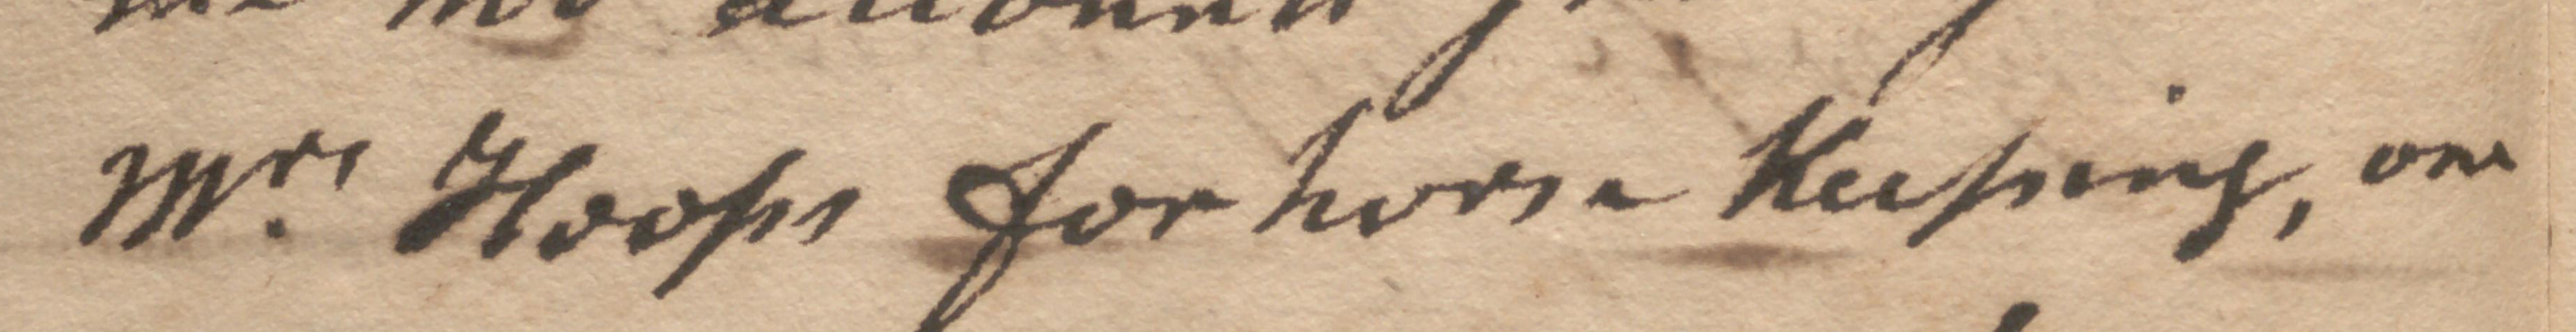M^r. Hoops for horse Keeping, one
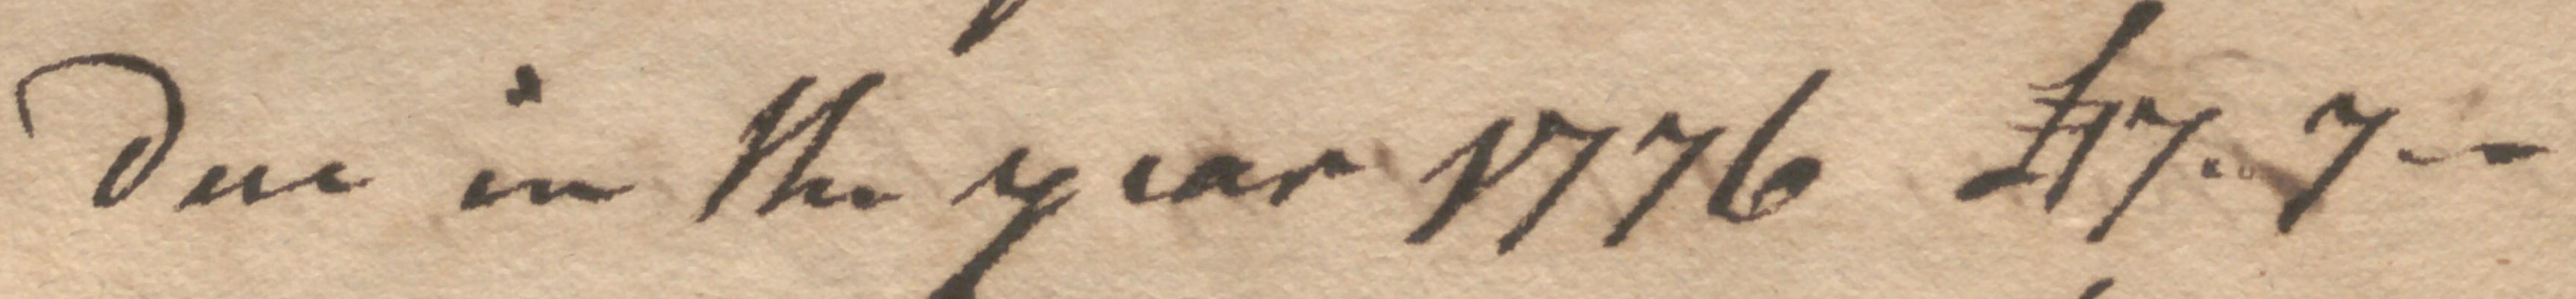due in the year 1776 £7.7-
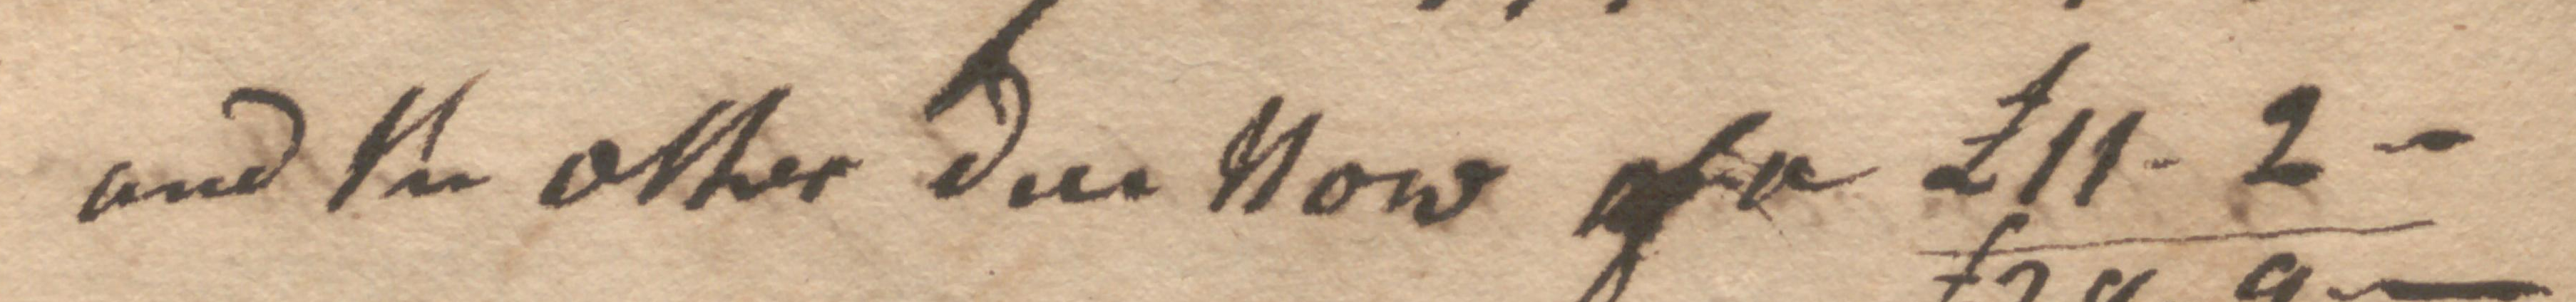and the other due Now of a £11.2-
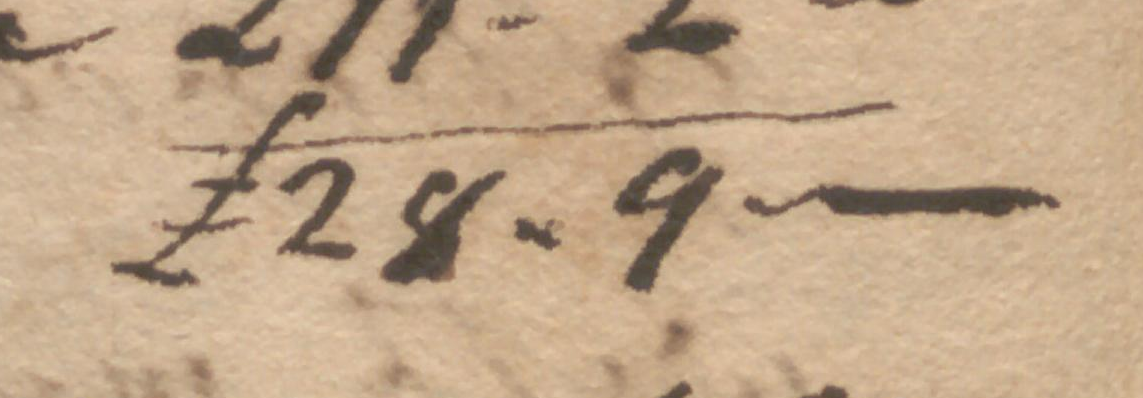£28.9-
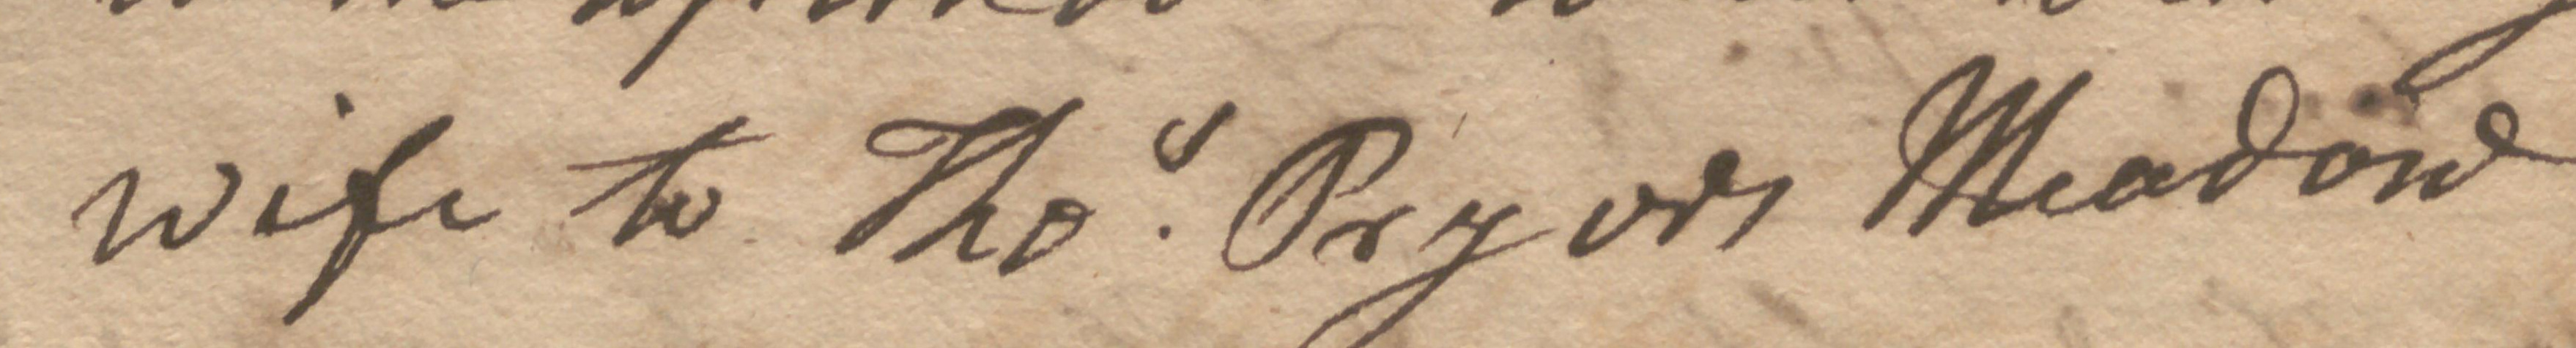wife to Tho^s. Pryors Meadow
